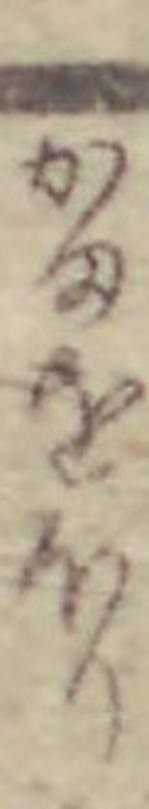かまをほり
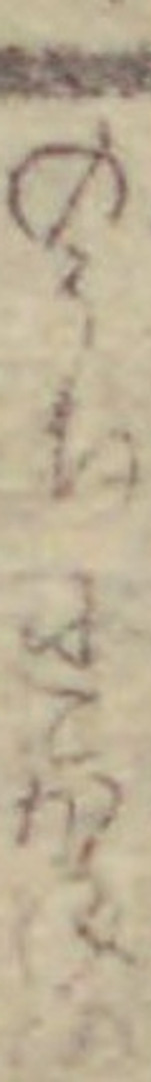のうちにこかねの
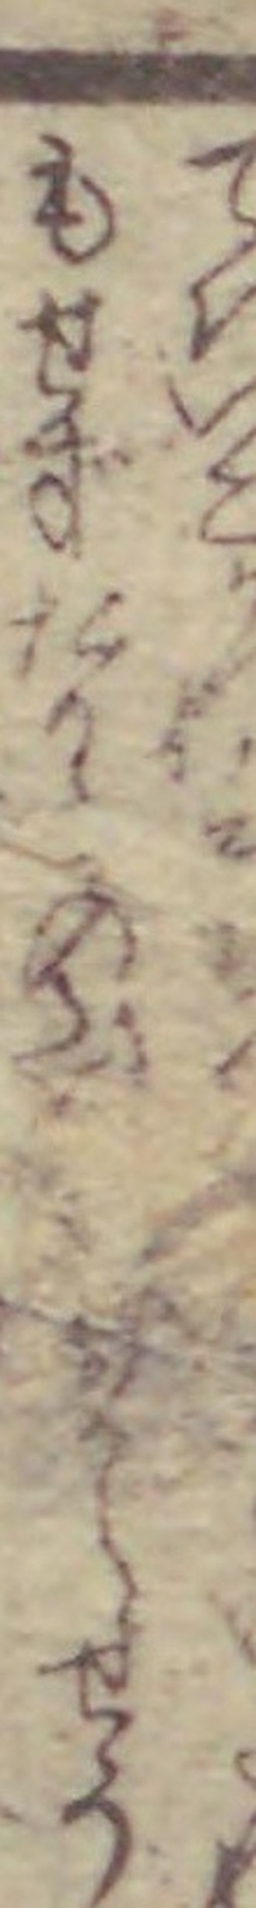もせずたかのせう
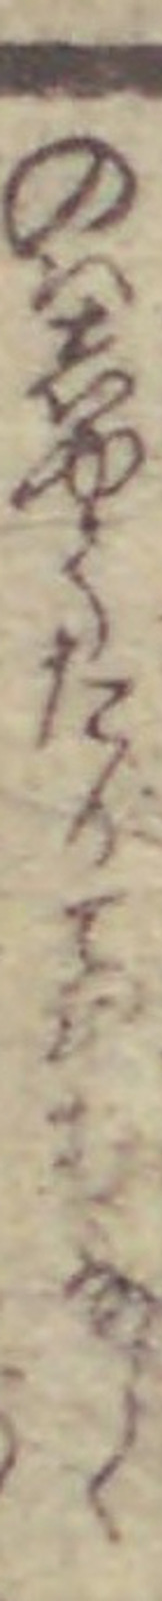のははしやうたがておむなしく
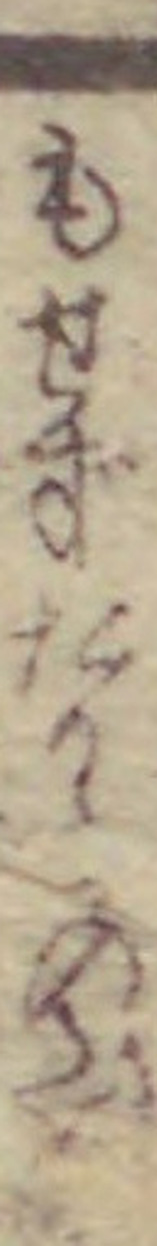もせずたかのせう
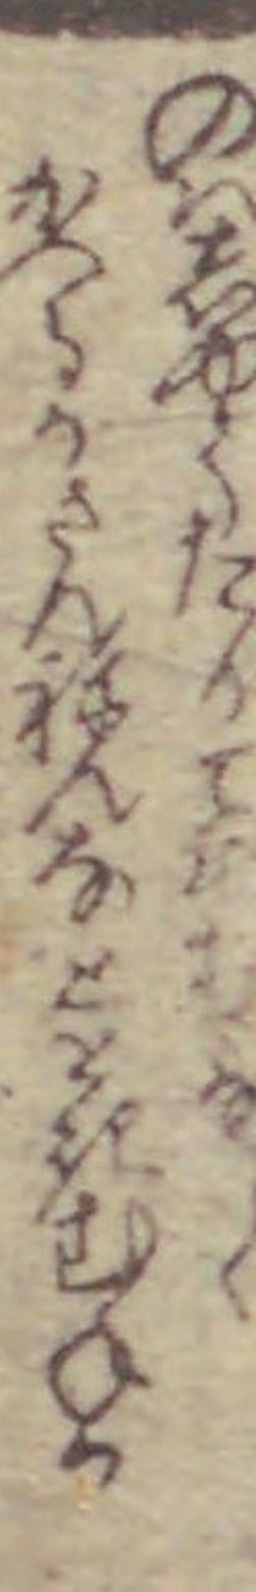かへるかさんねんなとときむねか
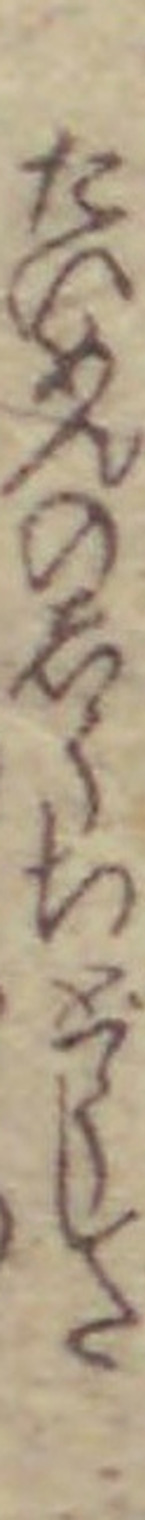たいめんのしうちどうした
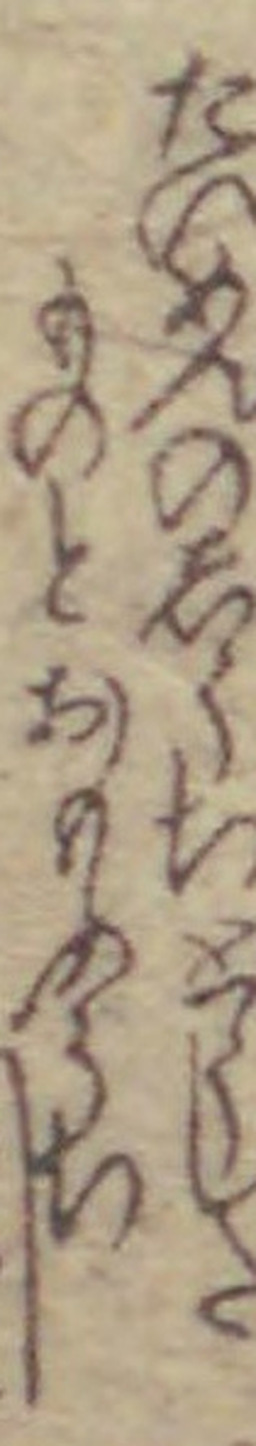ものとおもふうち

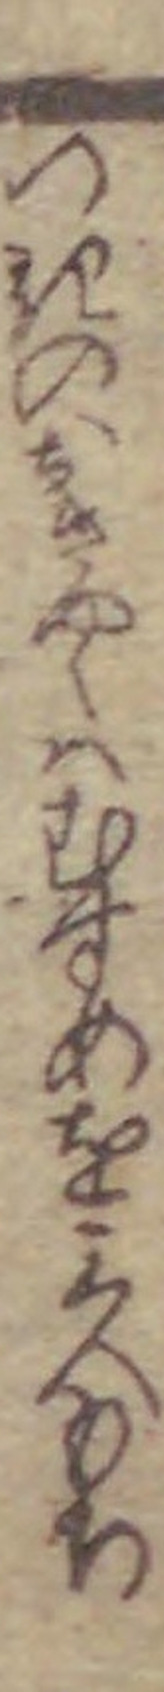つきのおきやくはむすめを三人もち
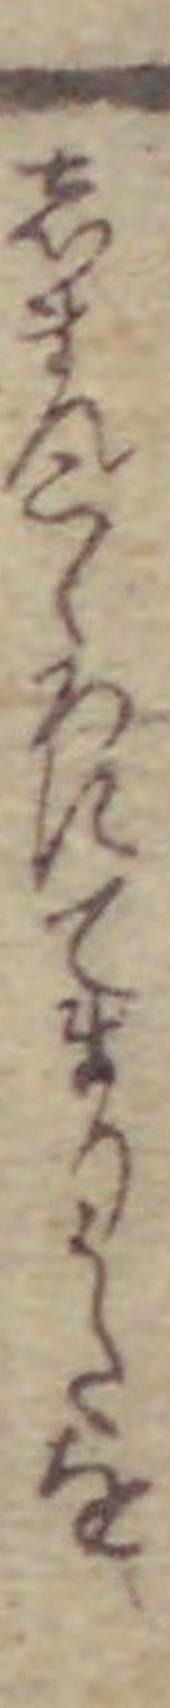しまんこゝろにてまりうたを
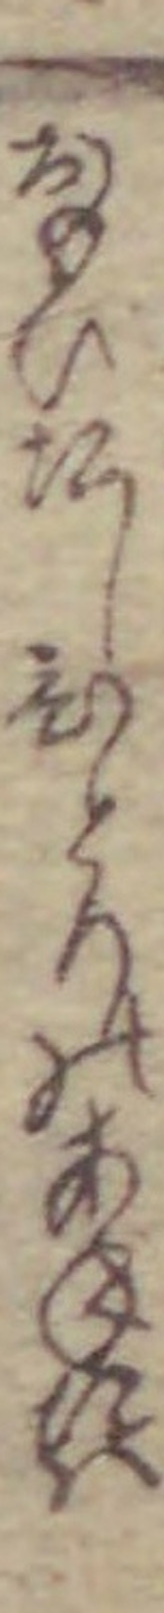おもひたしひとりのあねきは
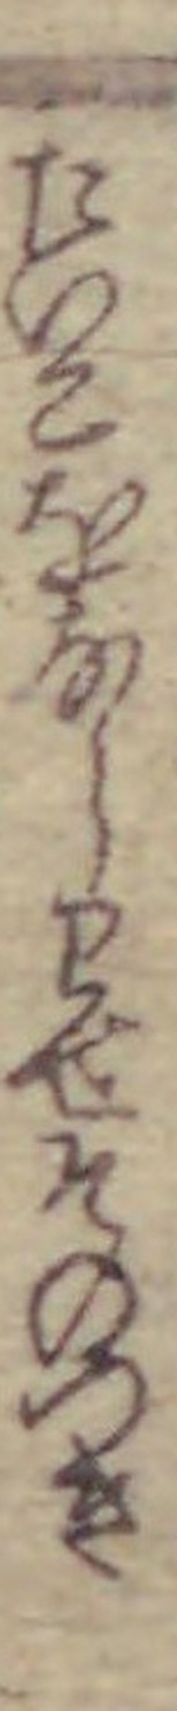たいこをならわせそのつき
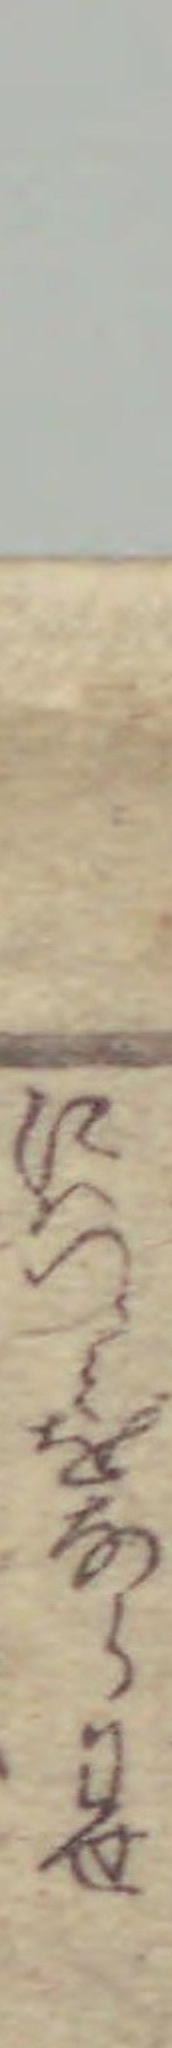にはつゝみをならわせ
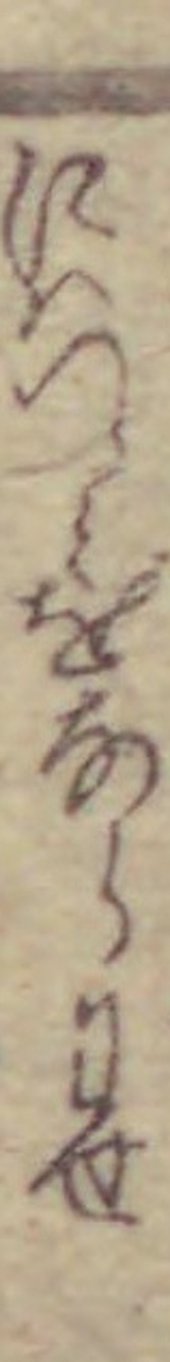にはつゝみをならわせ
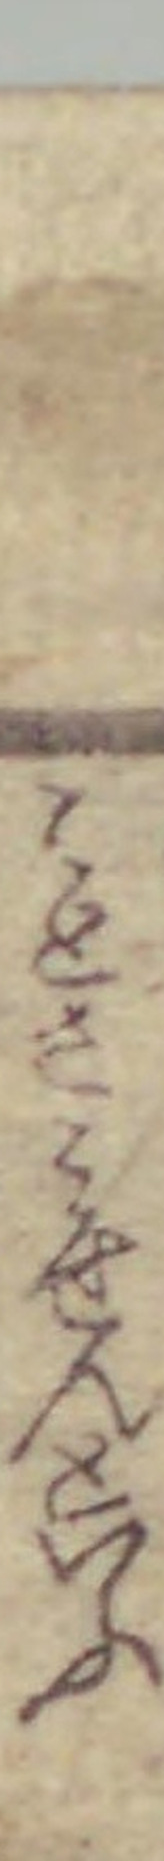ことさみせんといふ
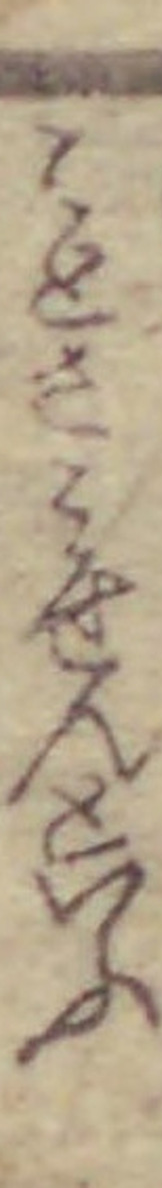ことさみせんといふ
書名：思事夢濃枕 3巻
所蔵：国立国会図書館 National Diet Library, JAPAN
